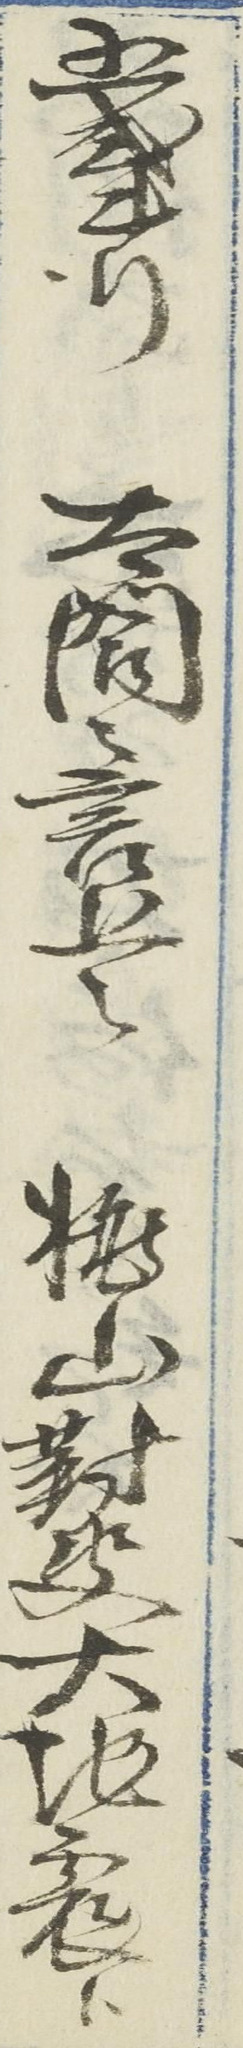五奉行太閤ニ言上し桃山対決大地震ト
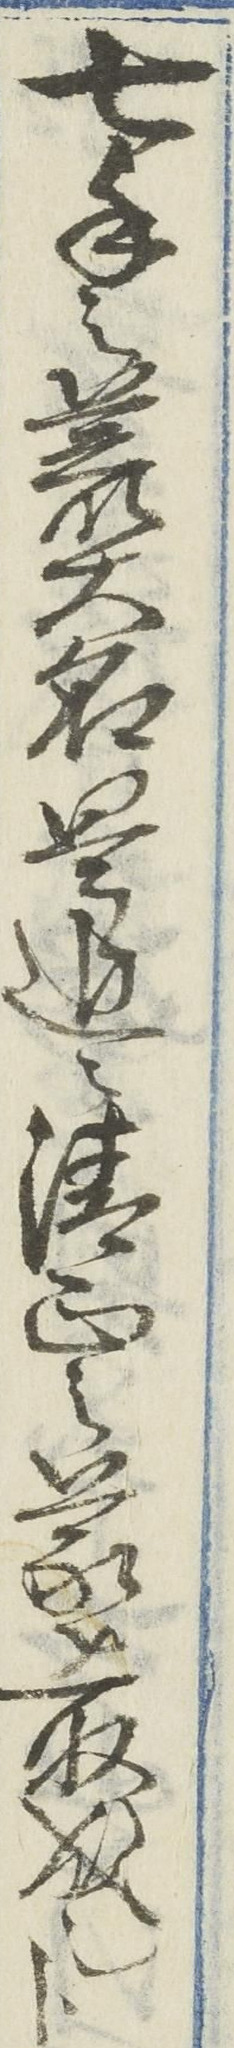七手之荒大名是追々清正之義ヲ取成シト
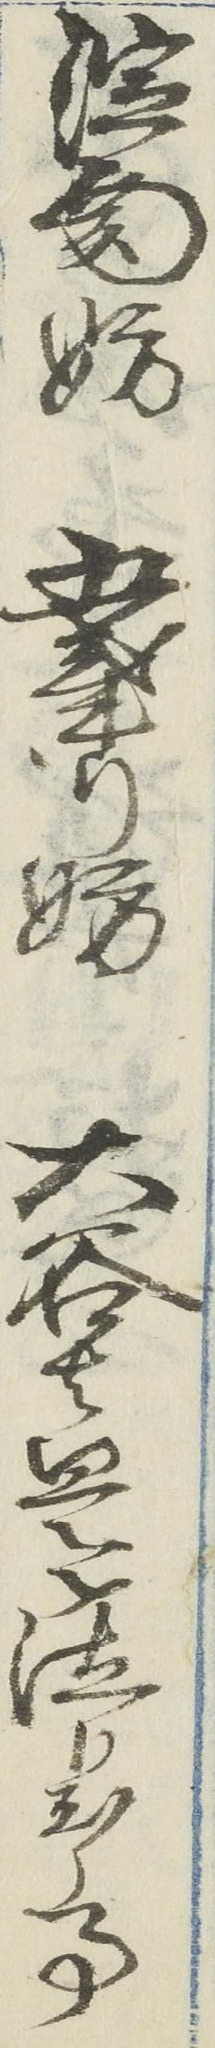淀殿妨五奉行妨大谷は是ヲ泣ト云う事
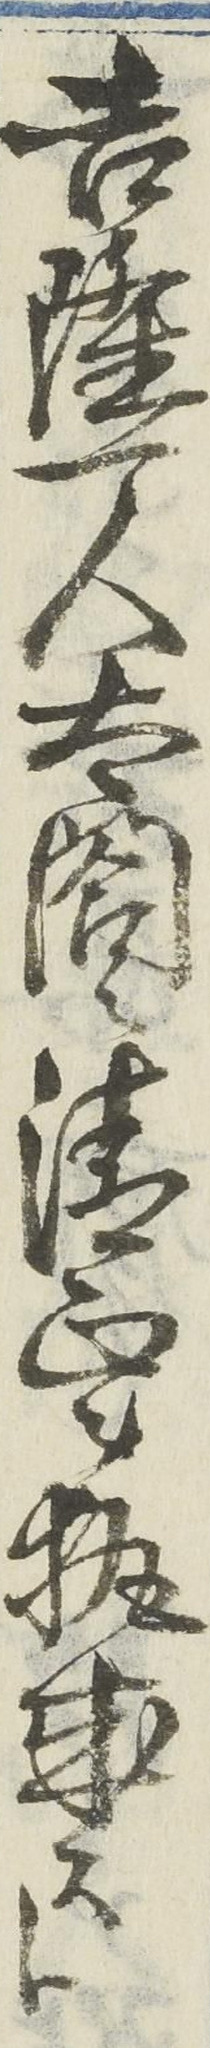吉隆一人太閤ニ清正ヲ執成スト
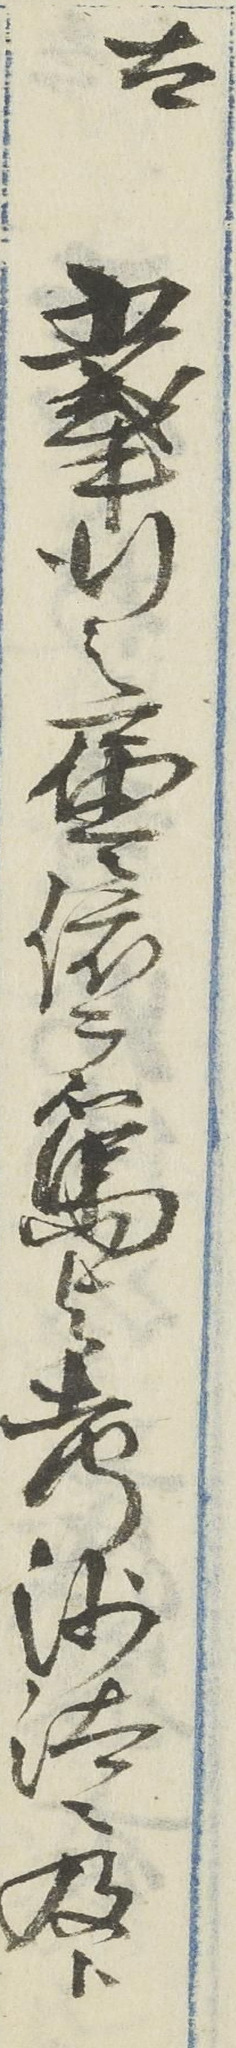太五奉行之届ニ依テ篤と考沙汰ニ及ト
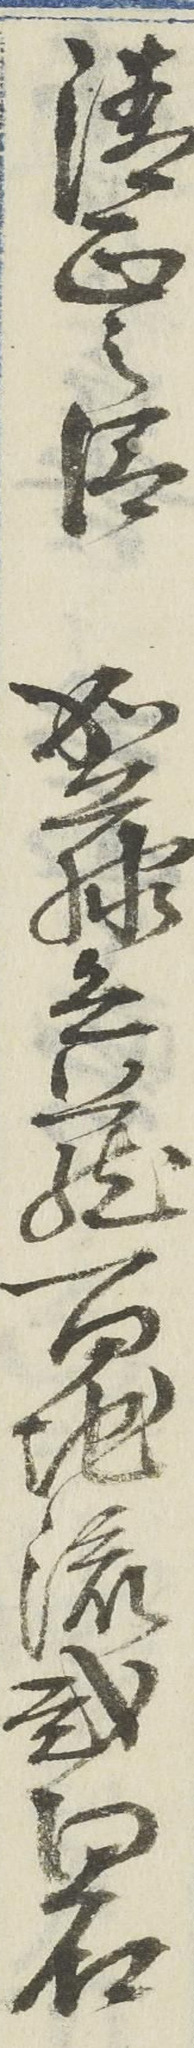清正之臣加藤兵蔵百地流弐百石
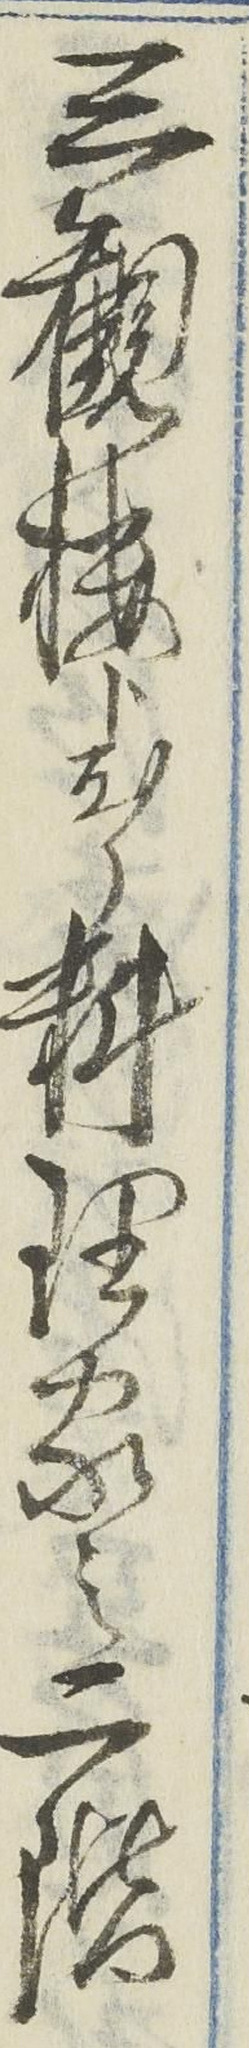三観楼ト云う料理家之二階
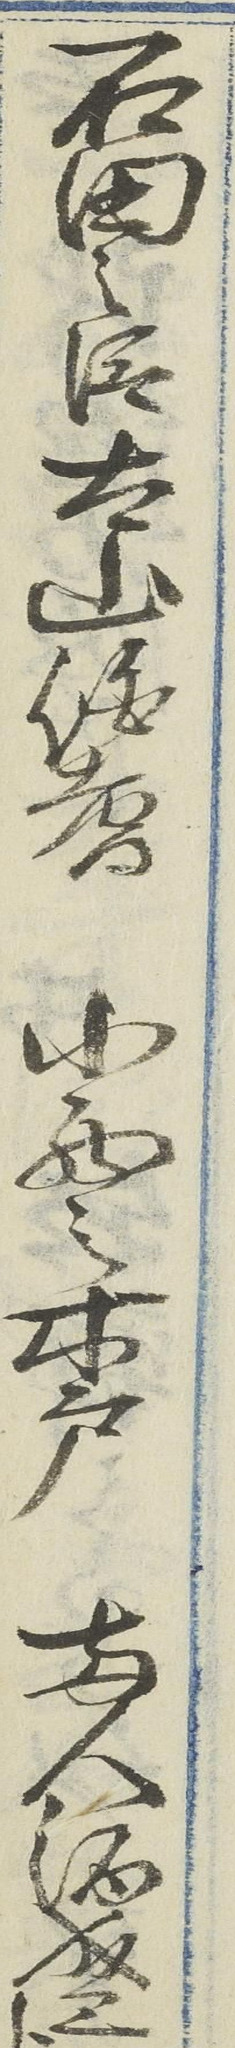石田之臣太山伯耆小西之木戸両人酒盛ト

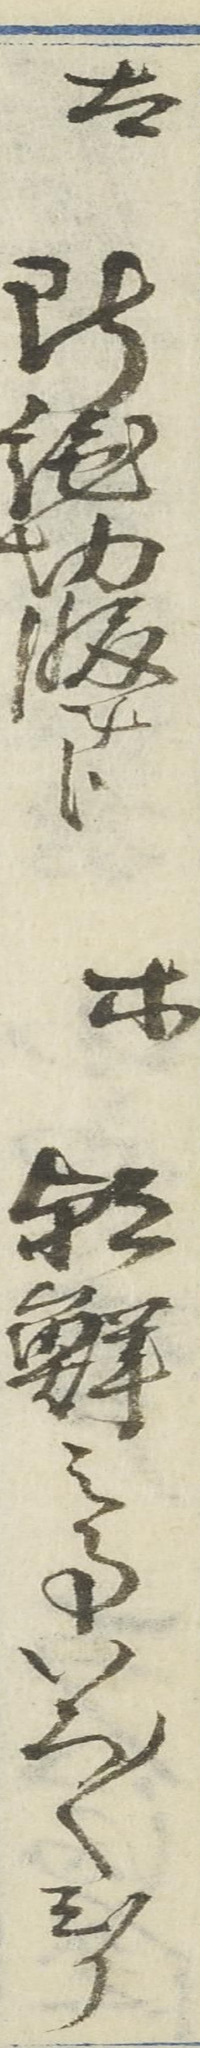太断絶切腹ヲト木朝鮮之事いろ〳〵云う
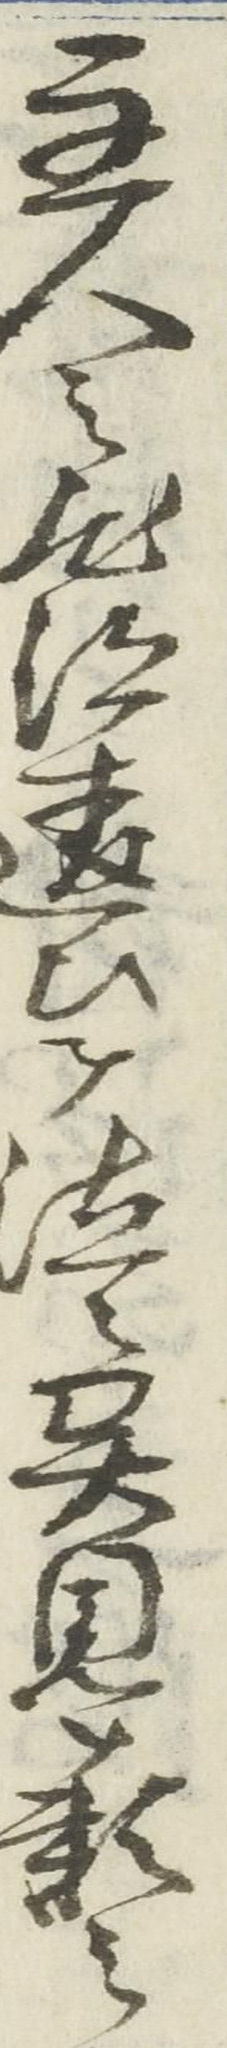主人之心得違ひヲ泣々異見ヲ頼ミ
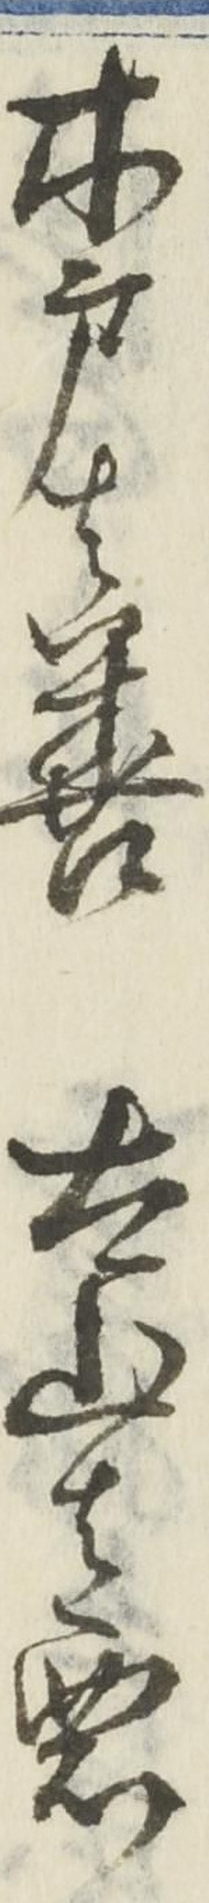木戸は善太山は悪
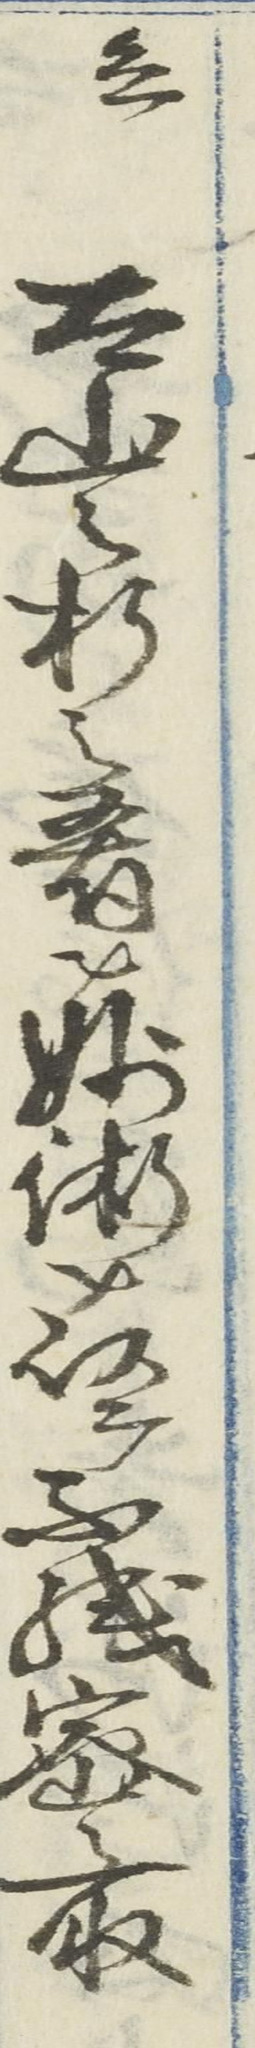兵太山之折之肴ヲ妙術ヲ以テ不残密ニ取
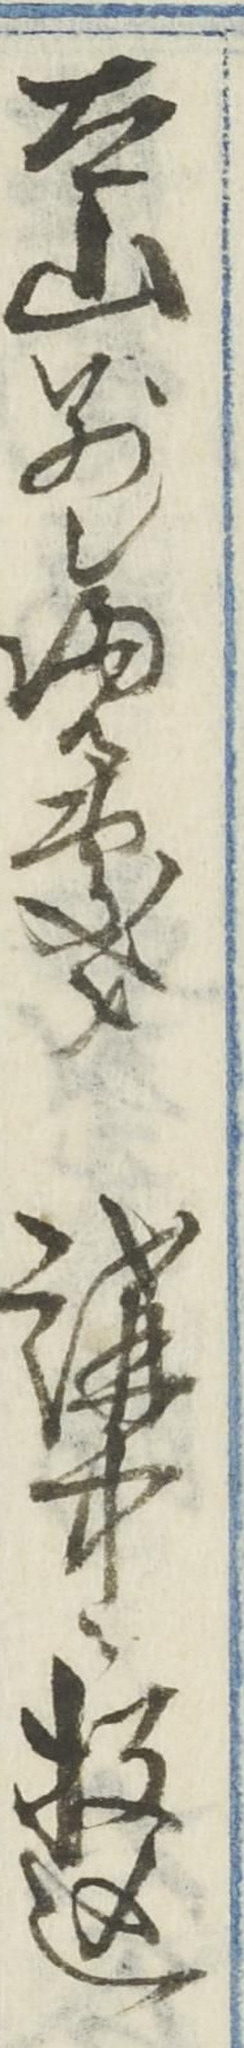太山別レ帰候処ヲ講中ニ投込
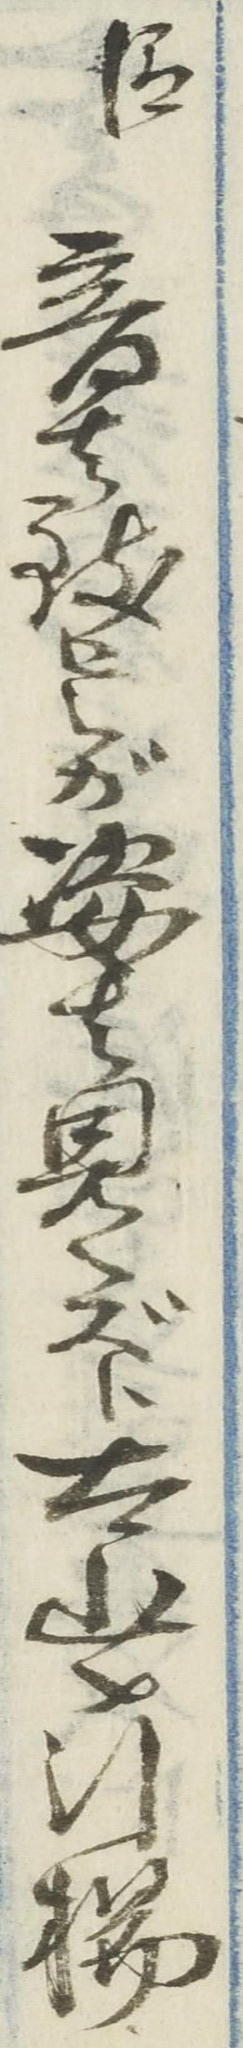臣音は致セシガ姿は見へズト太山ヲ引揚
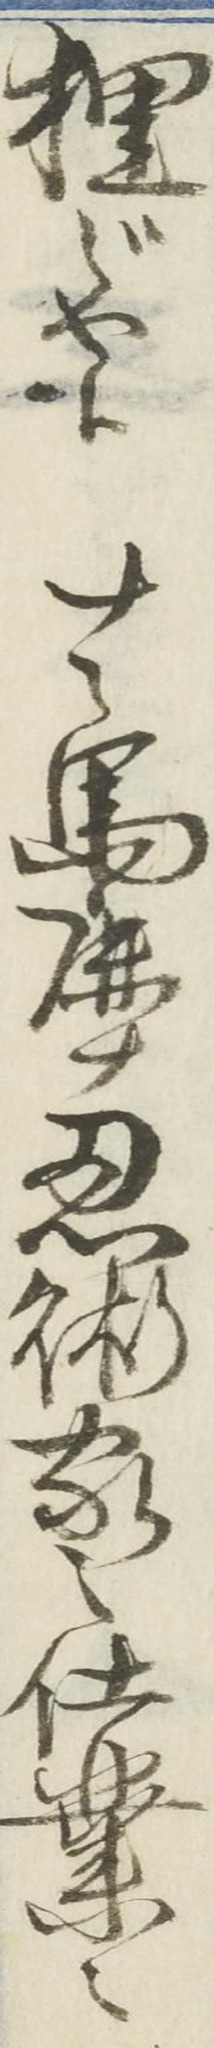狸じやトナニ馬鹿ナ忍術家之仕業也
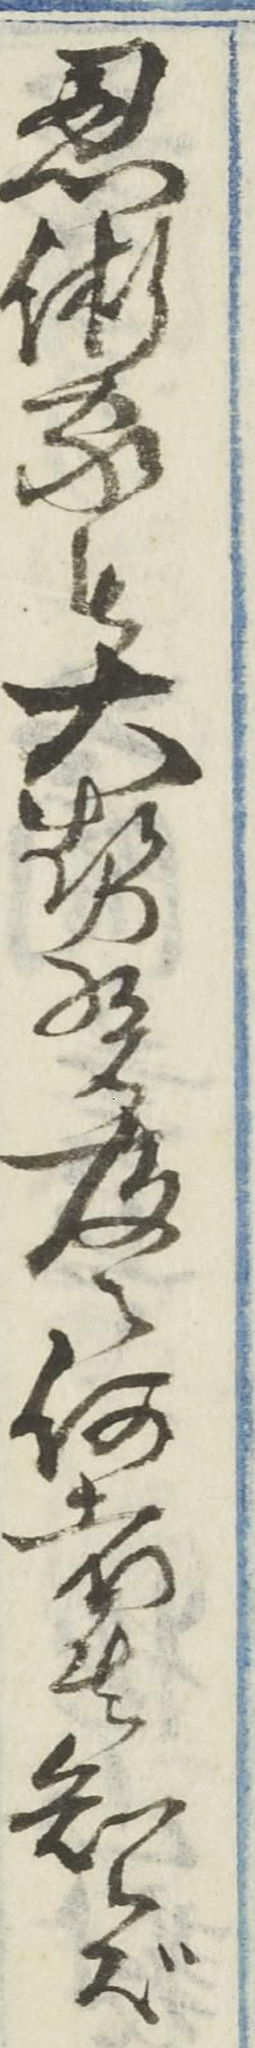忍術家も大勢有ル故ニ何者共知らズ
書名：伏水大地震
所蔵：東京大学地震研究所図書室 Earthquake Research Institute Library, The University of Tokyo, JAPAN
